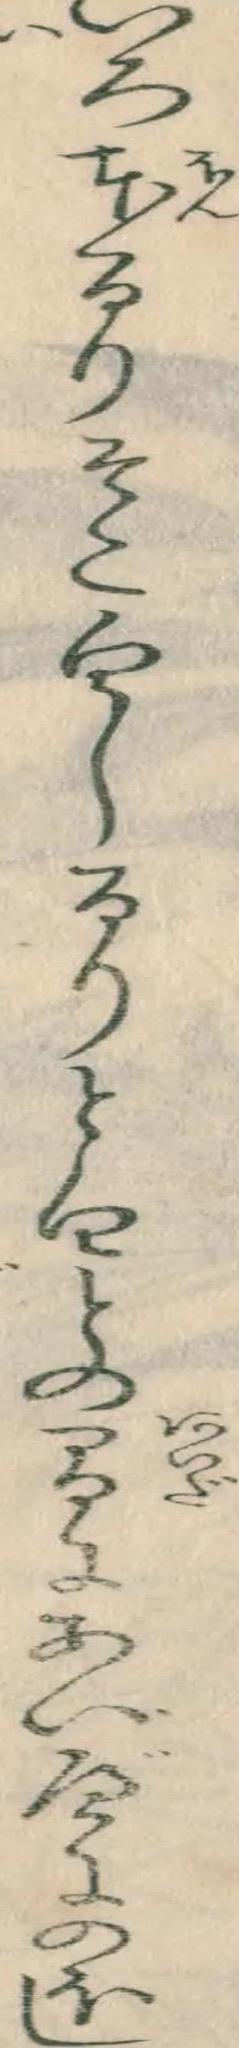いろ本るりそこ白しるりと白との間にあいべにのほし
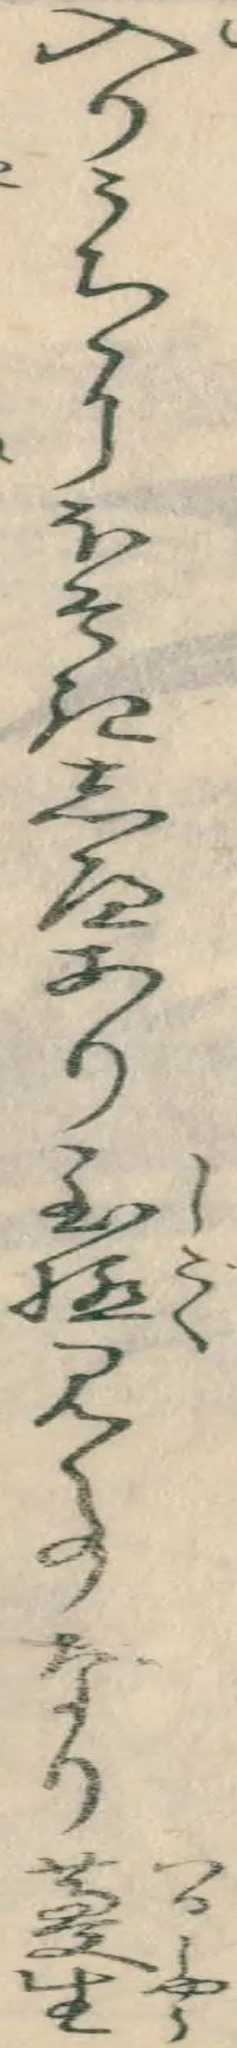入りうちにほそきしへあり至極見事なり蔓生
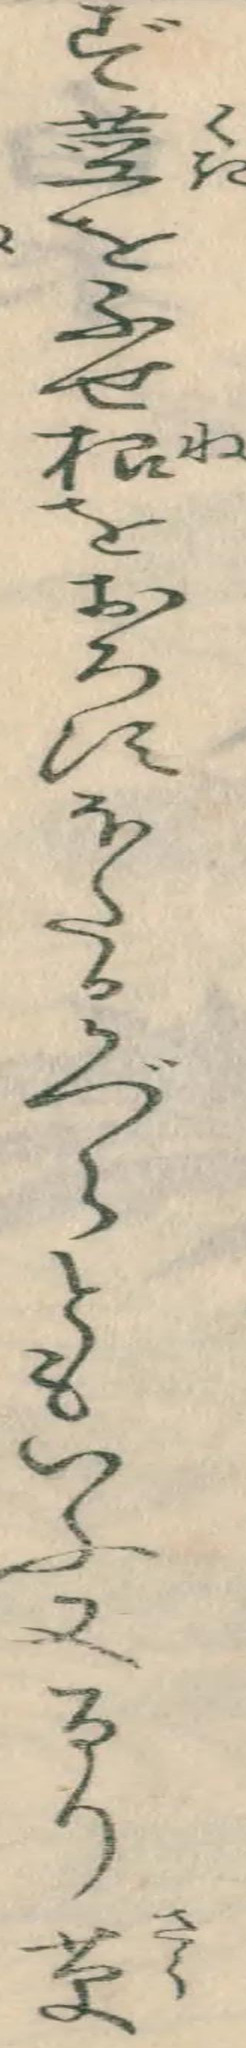ず茎をふせ根をおろすほたるかづらともいふ又るり草
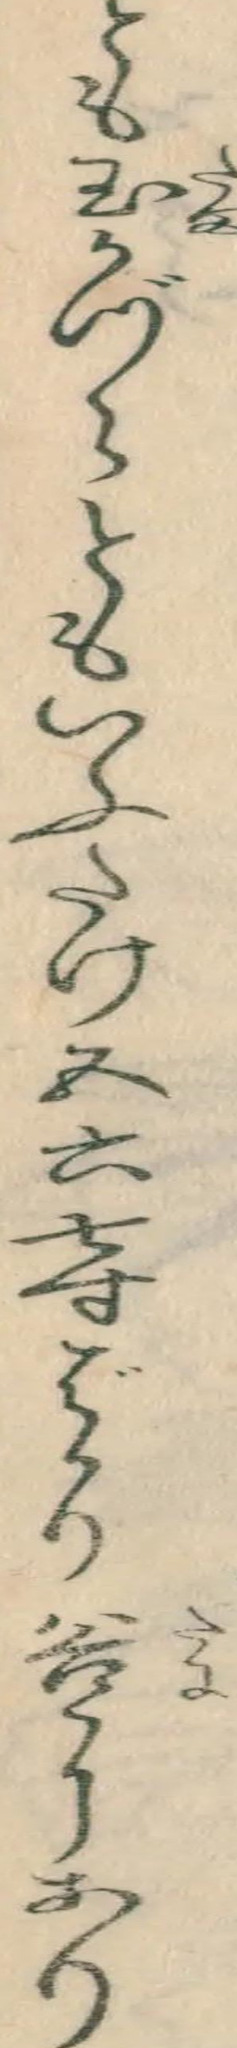とも玉かづらともいふたけ五六七寸ばかり谷にあり

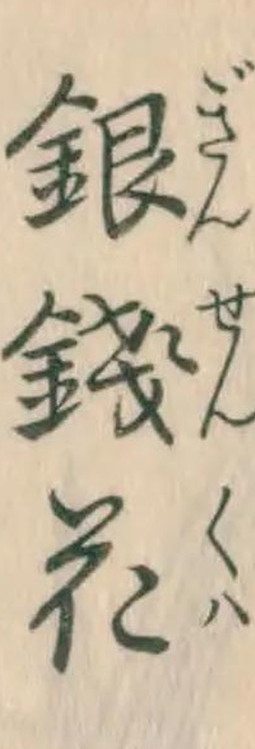銀銭花
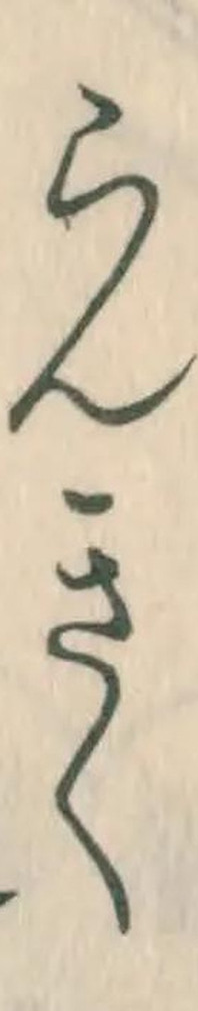らんきく

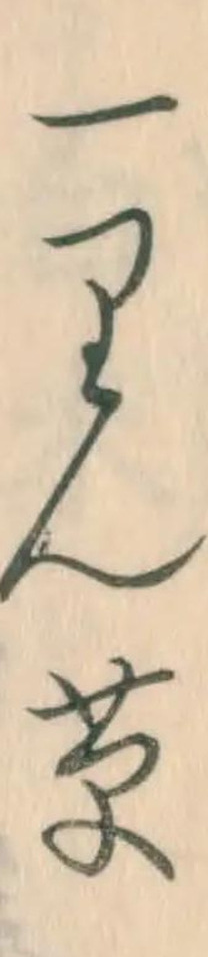一りん草
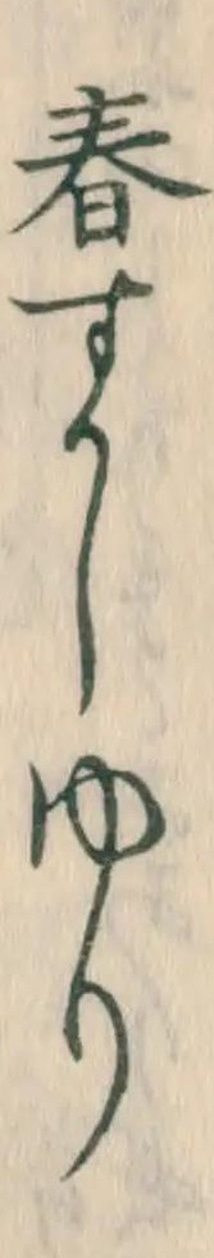春すかしゆり

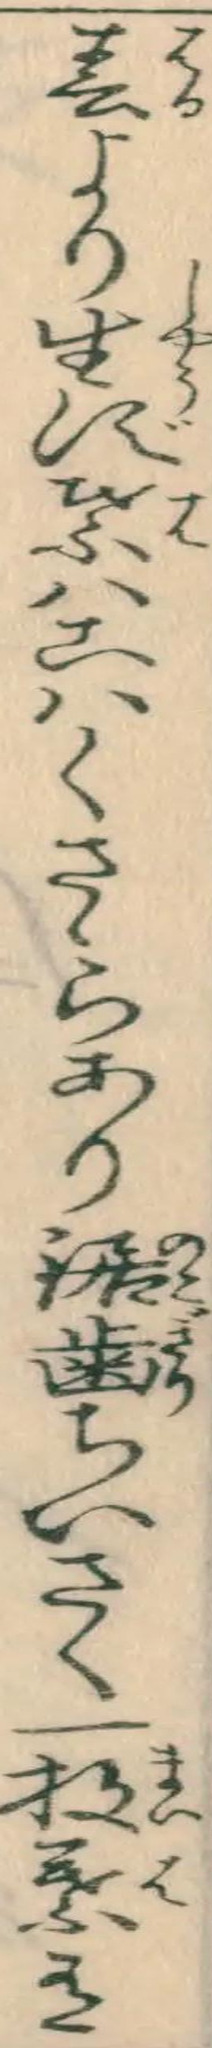春より生ず葉はこはくさゝらあり鋸歯ちいさく一枚葉有
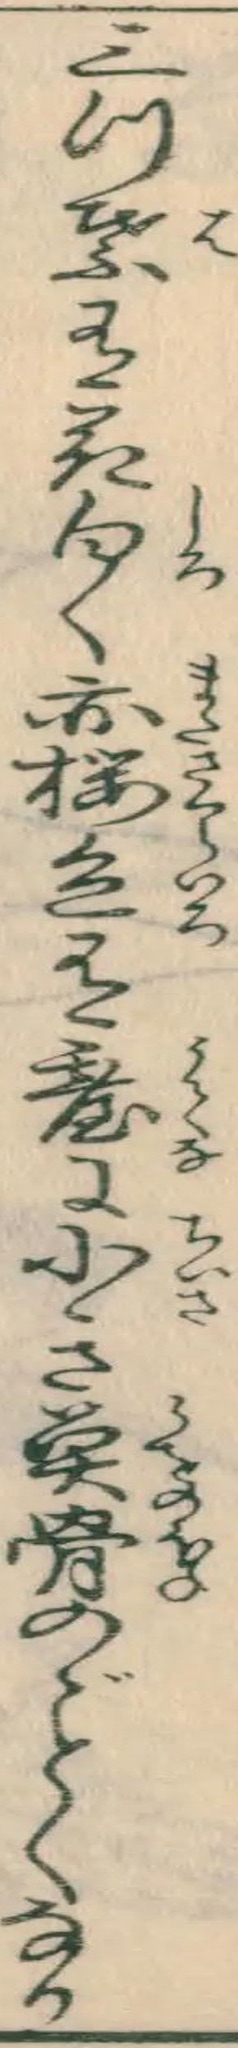三つ葉有花白く亦桜色有台に小き魚骨のごとくなり
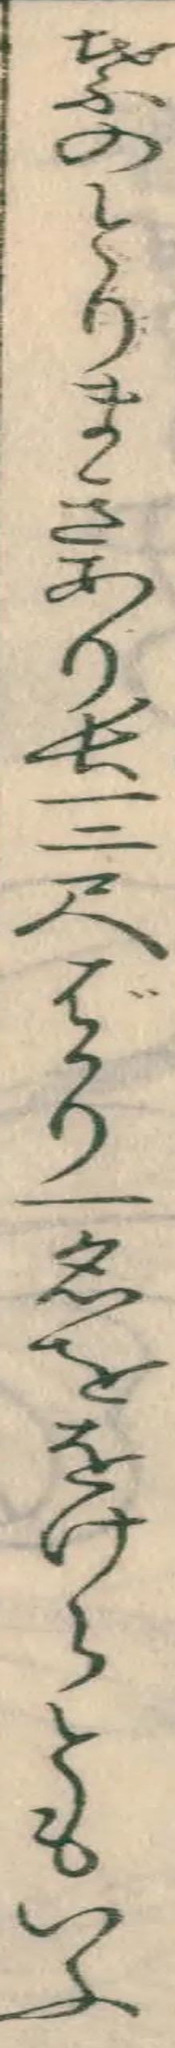葉のとりまきあり長一二尺ばかり一名ををけらともいふ
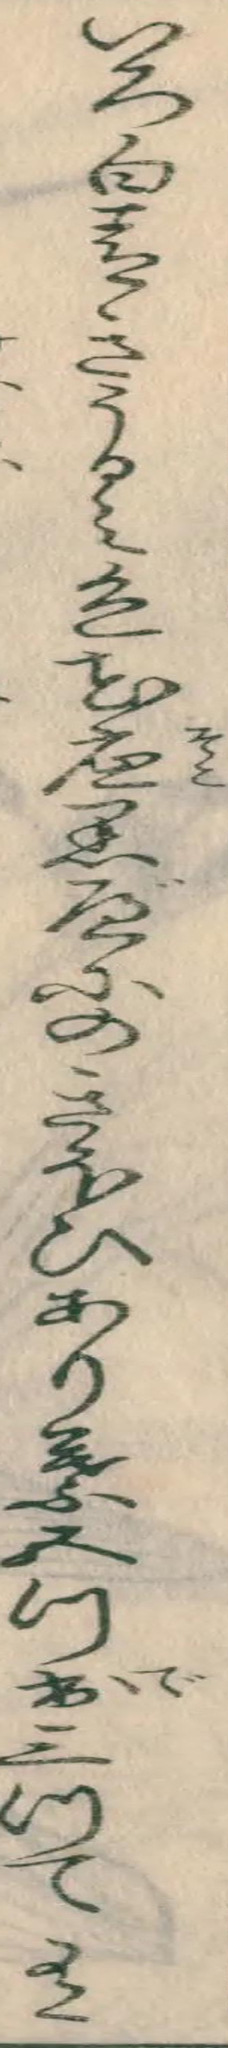いろ白青きうるみ色花底黒べにのきほひあり葉五つ出三つて有
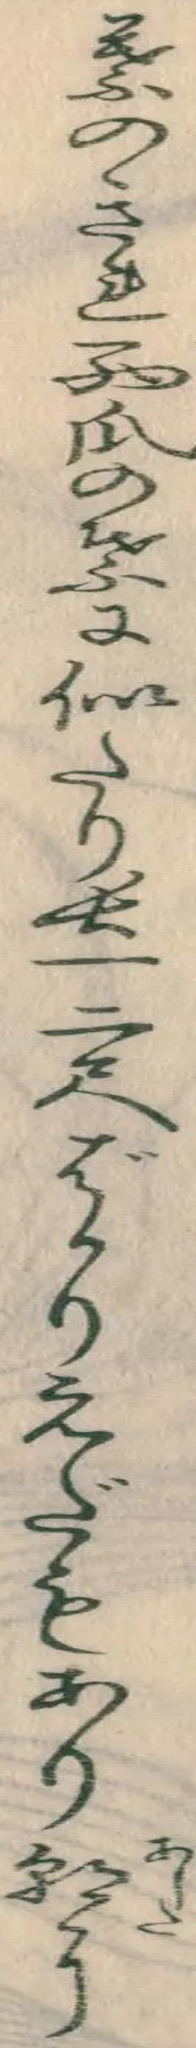葉のきれ西瓜の葉に似たり長一二尺ばかりえだもあり朝に
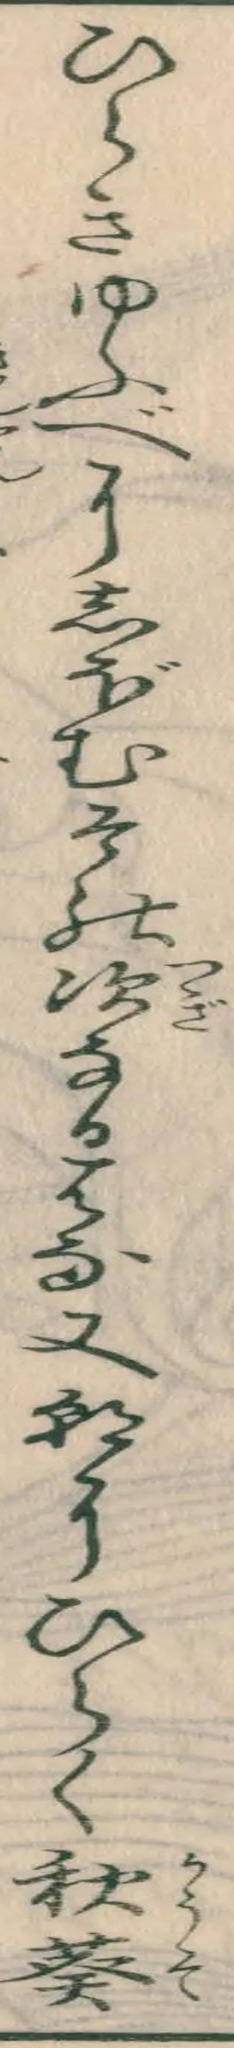ひらきゆふべにしぼむその次なるはな又朝にひらく秋葵
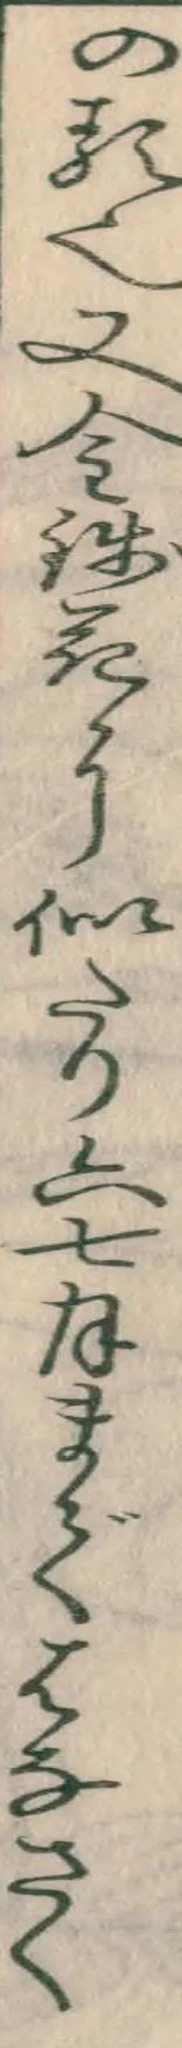の類也又金銭花に似たり六七月まではなさく
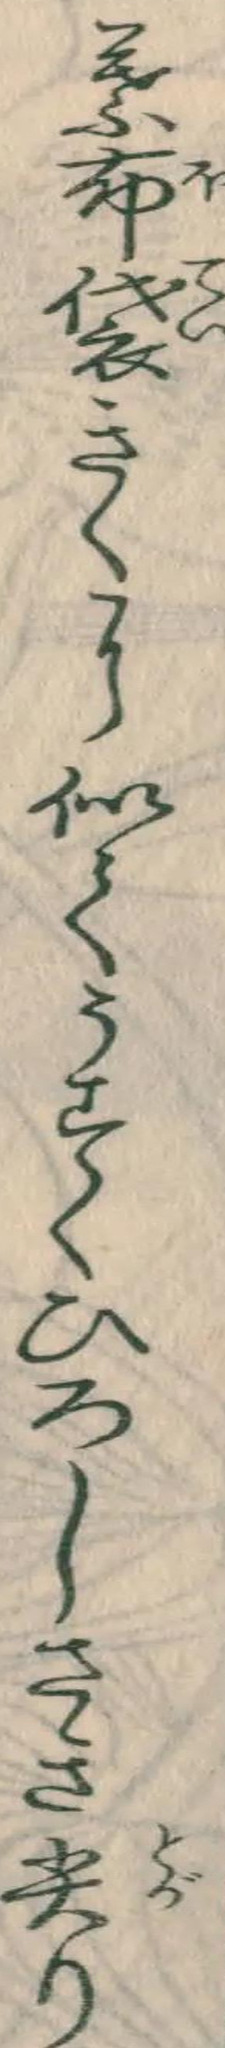葉布袋きくに似てうすくひろしさき尖り
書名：畫本野山草. [1]
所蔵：国立国会図書館 National Diet Library, JAPAN
